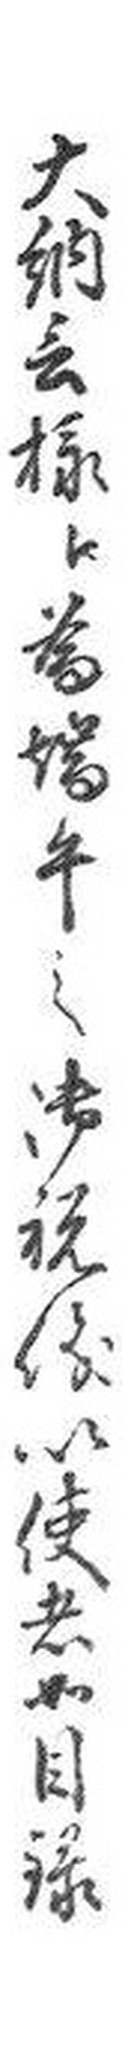大納言様江為端午之御祝儀以使者如目録
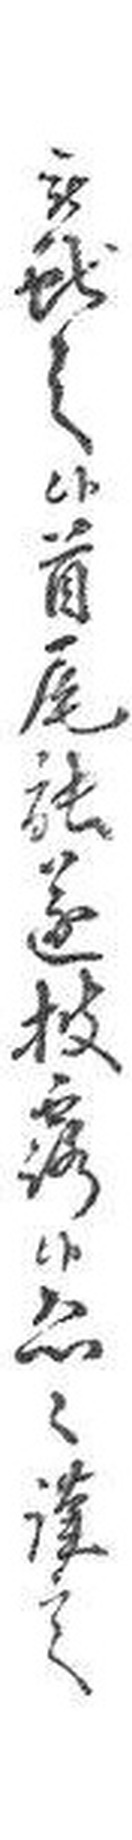被献之候首尾能遂披露候恐々謹言
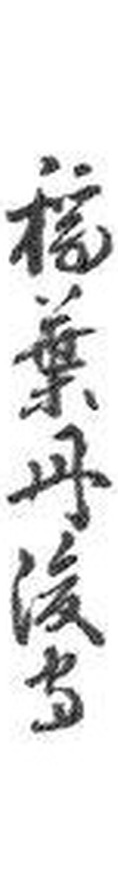稲葉丹後守
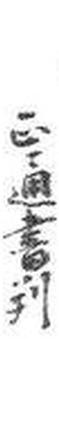正通書判
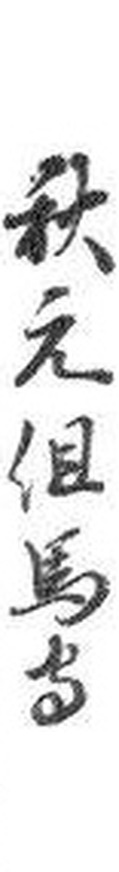秋元但馬守
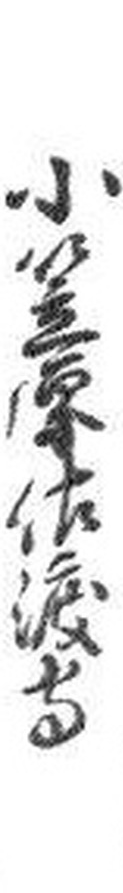小笠原佐渡守
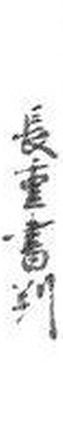長重書判
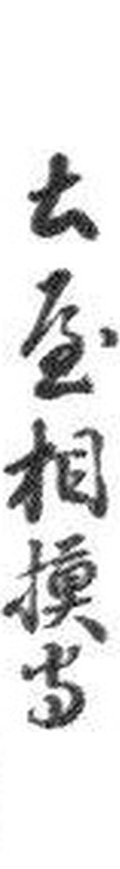土屋相模守
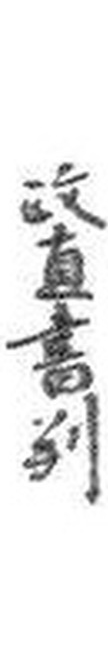政直書判
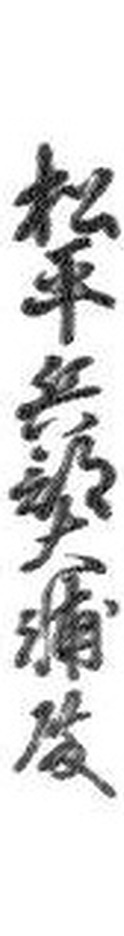松平兵部大輔殿
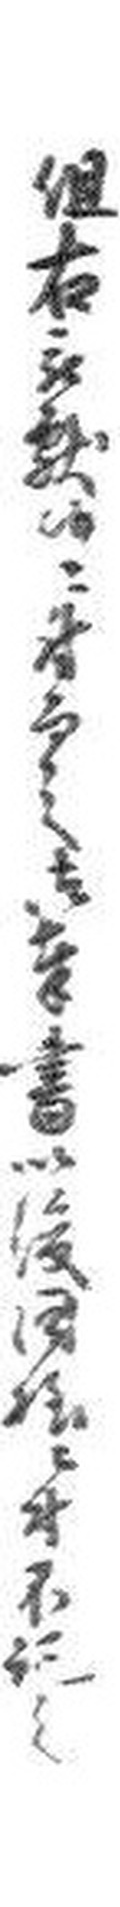但右被献候ニ付而之御奉書以後同様ニ付不記之
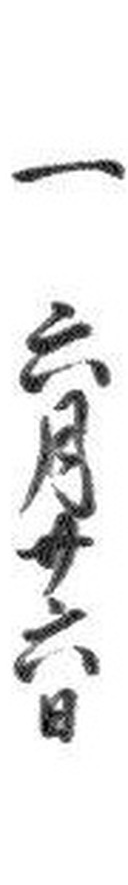一六月廿六日
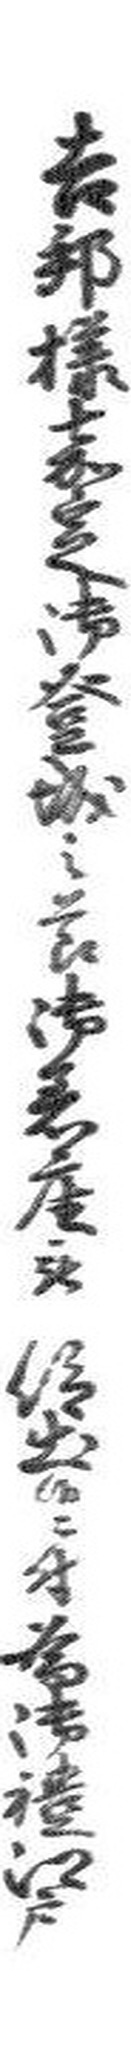吉邦様嘉定御登城之節御着座被仰出候ニ付為御礼江戸
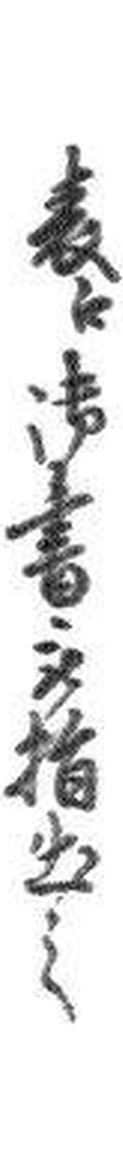表江御書被指出之
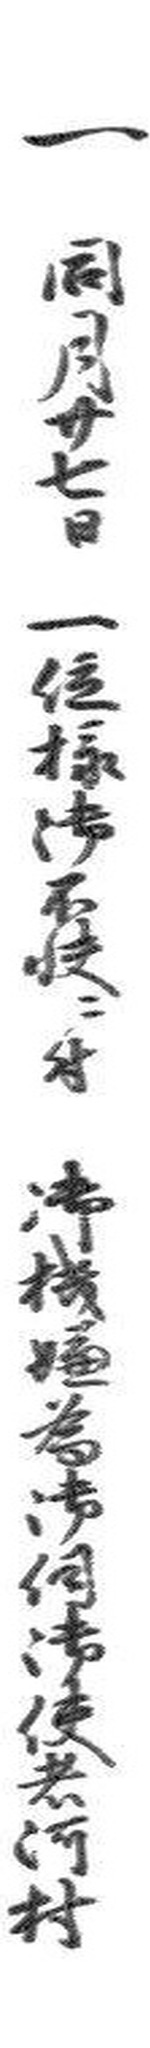一同月廿七日一位様御不快ニ付御機嫌為御伺御使者河村
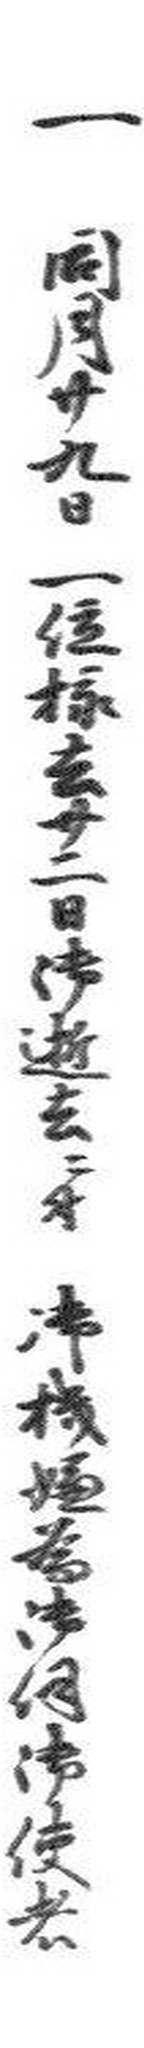一同月廿九日一位様去廿二日御逝去ニ付御機嫌為御伺御使者
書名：家譜 二十三 吉品公 従宝永元年到同二年
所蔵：福井県文書館 Fukui Prefectural Archives
